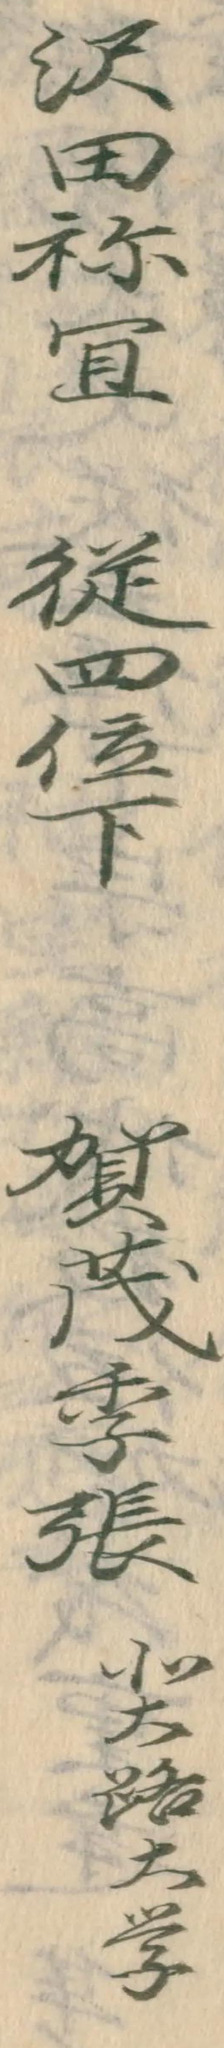沢田祢宜従四位下賀茂季張北大路大学
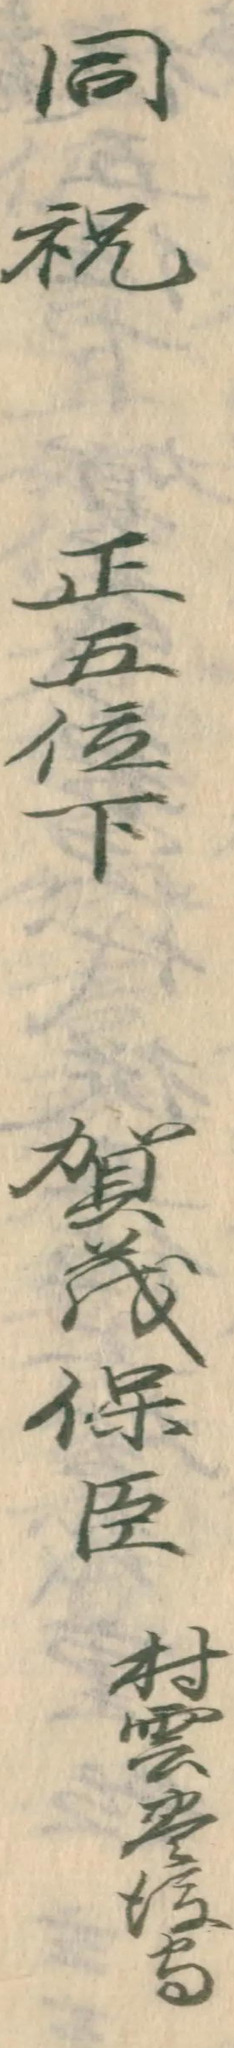同祝正五位下賀茂保臣村雲豊後守
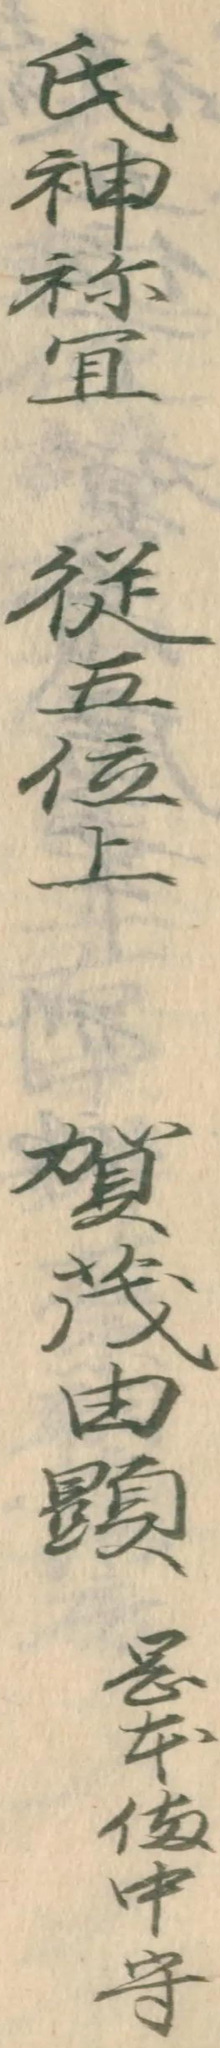氏神祢宜従五位上賀茂由顕岡本備中守
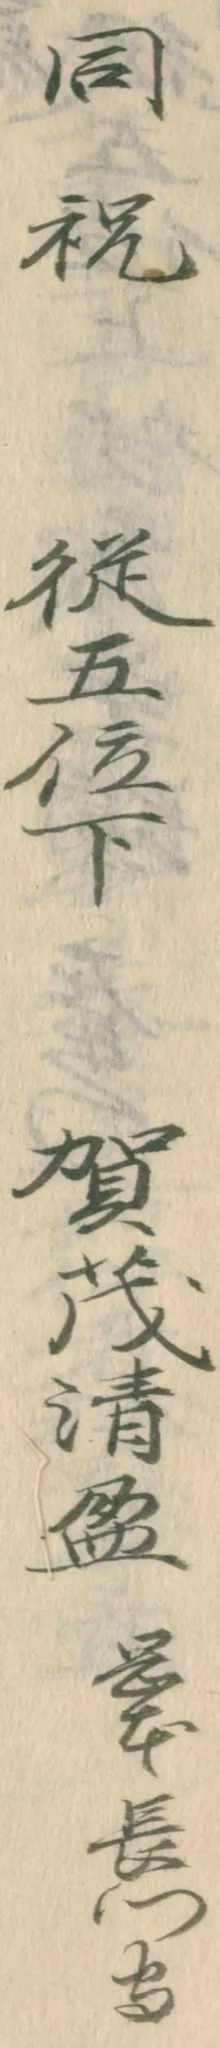同祝従五位下賀茂清盈岡本長門守
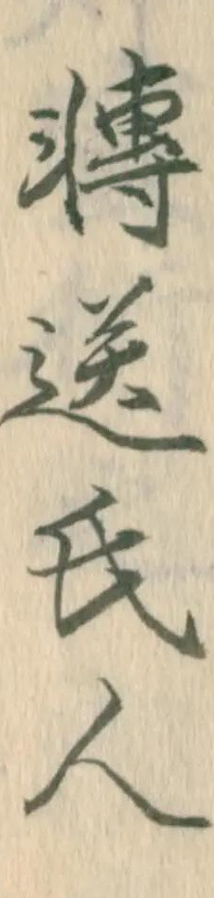転送氏人
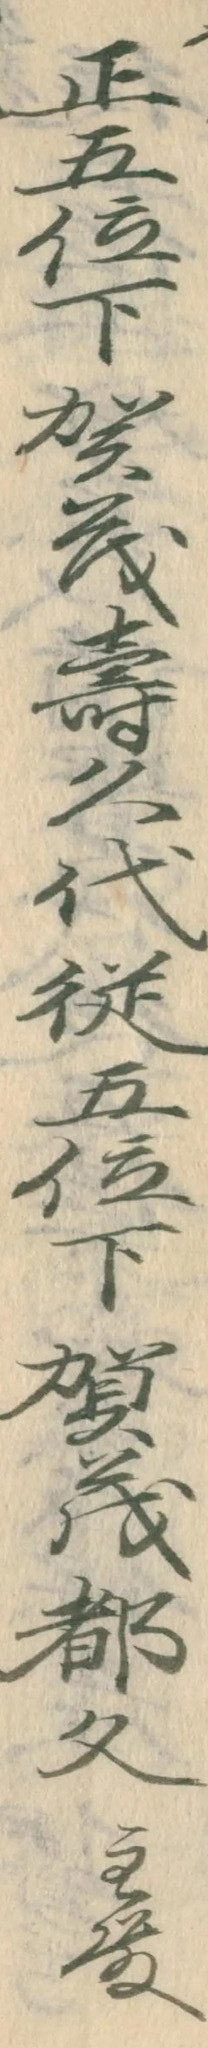正五位下賀茂寿久代従五位下賀茂都久主殿

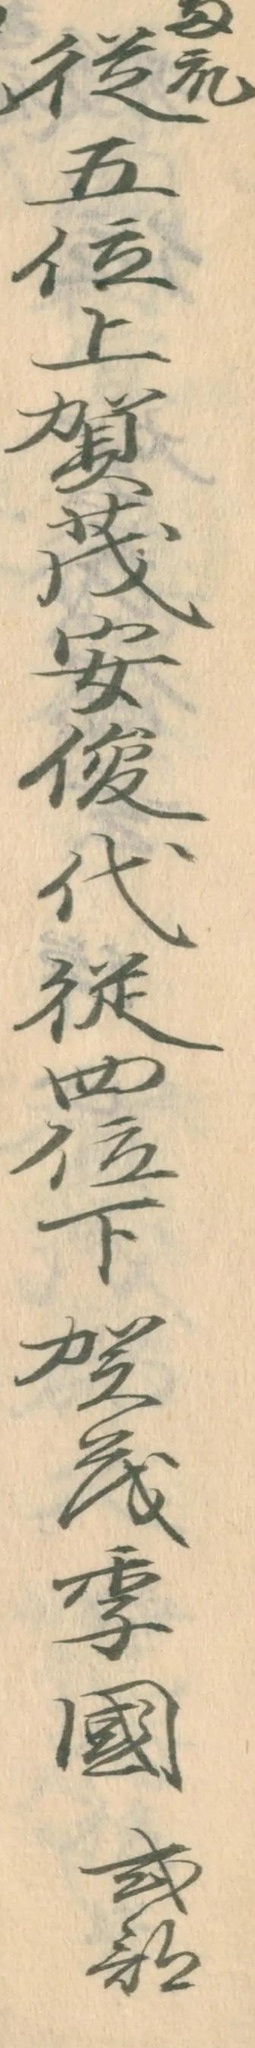従五位上賀茂安俊代従四位下賀茂季国式部
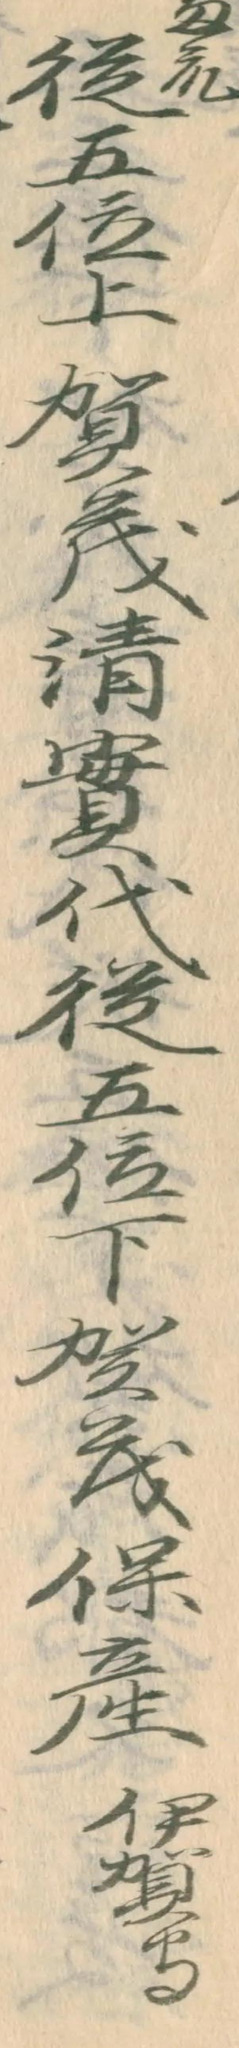従五位上賀茂清実代従五位下賀茂保産伊賀守
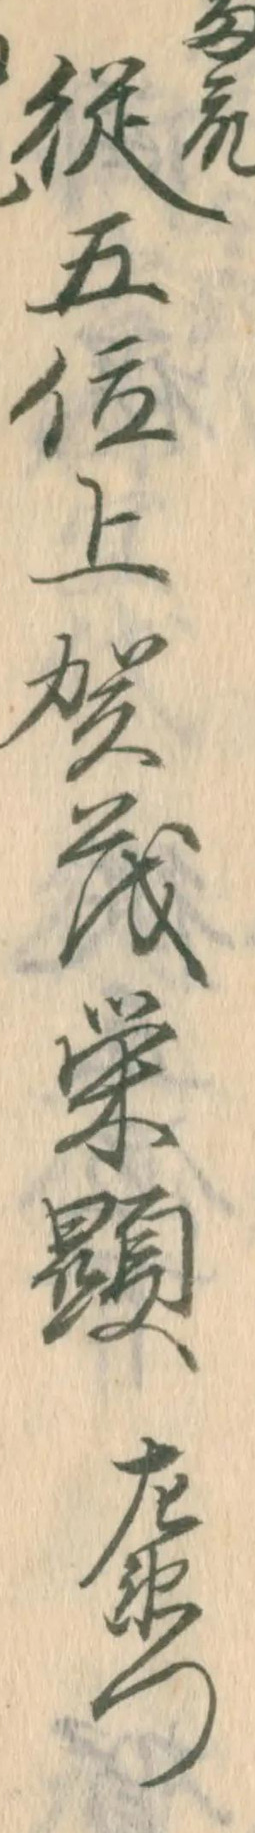従五位上賀茂栄顕左衛門
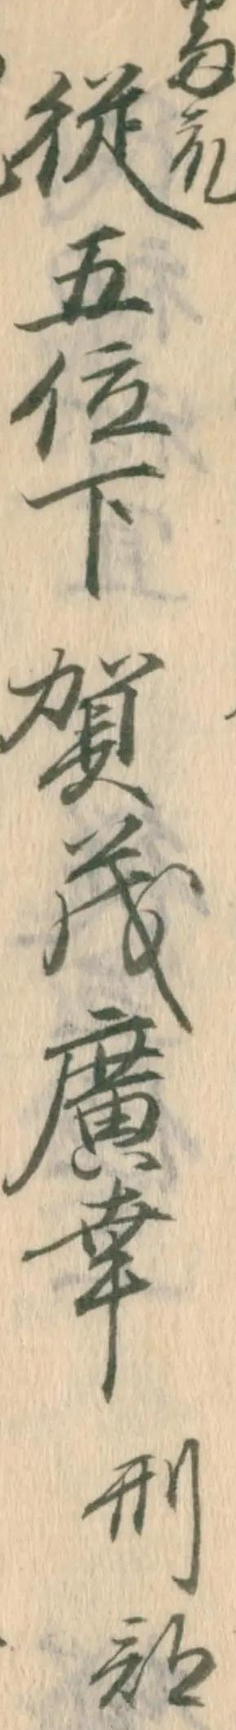従五位下賀茂広幸刑部
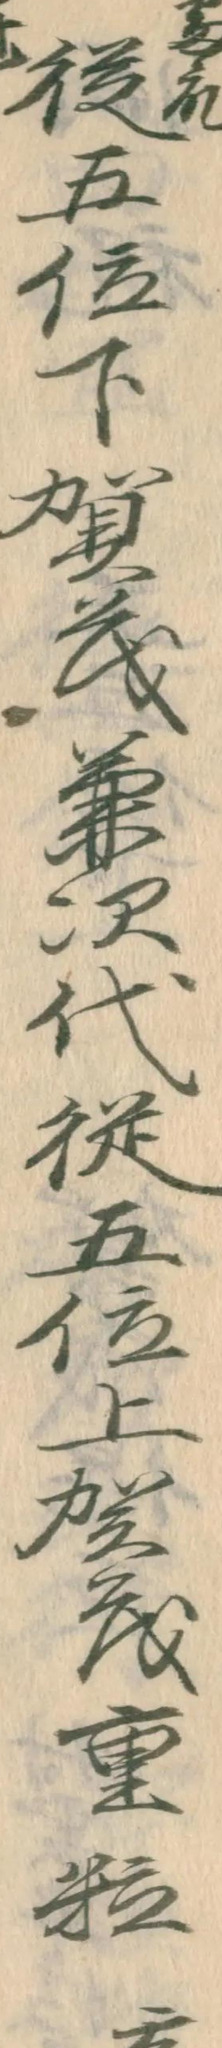従五位下賀茂兼次代従五位上賀茂重粒玄蕃
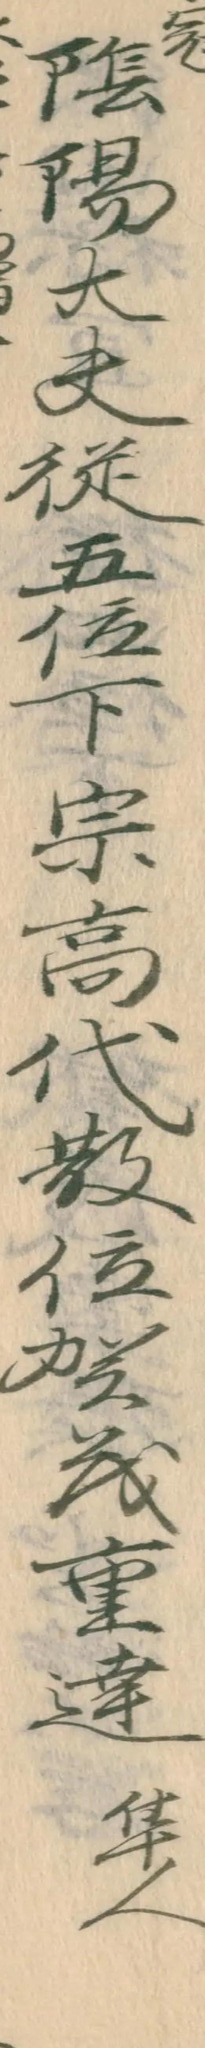陰陽大夫従五位下宗高代散位賀茂重達隼人
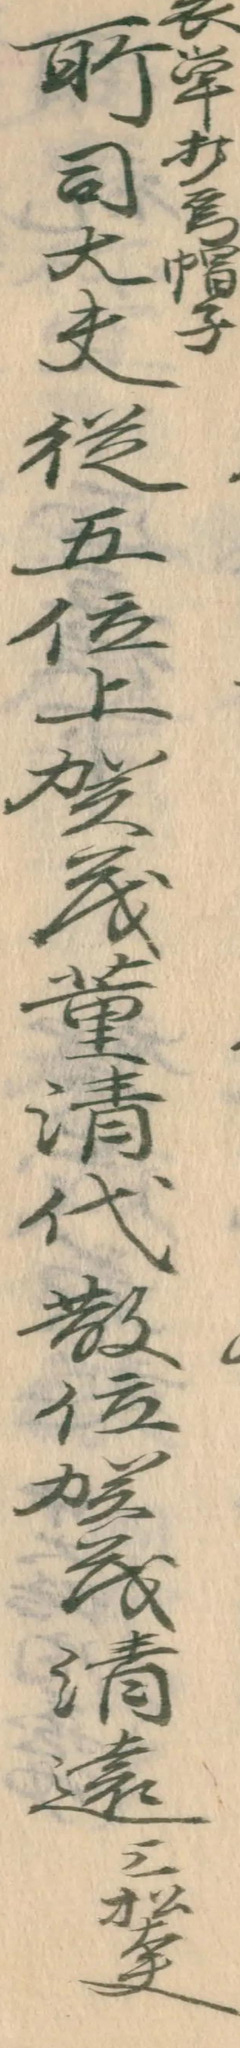所司大夫従五位上賀茂菫清代散位賀茂清遠三松大夫
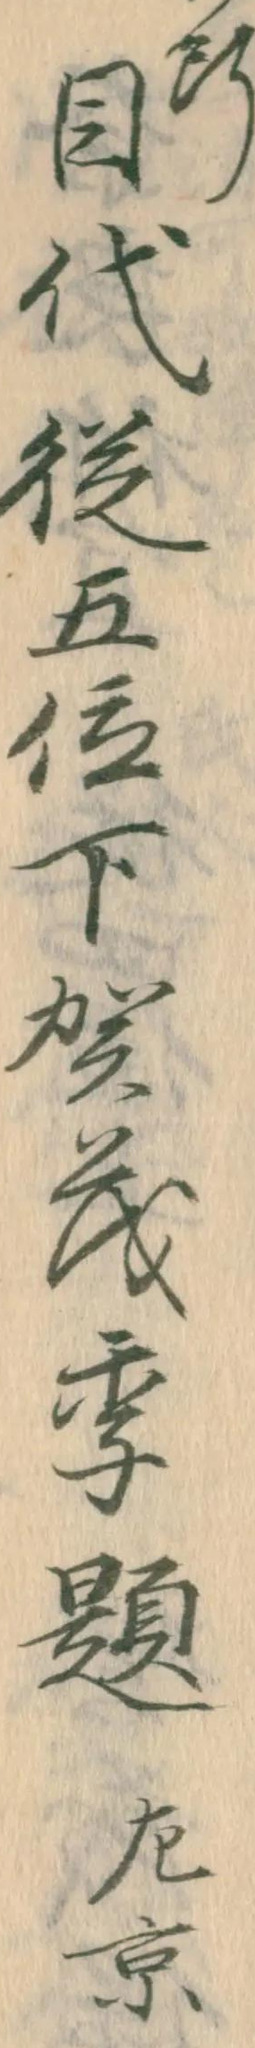目代従五位下賀茂季題左京
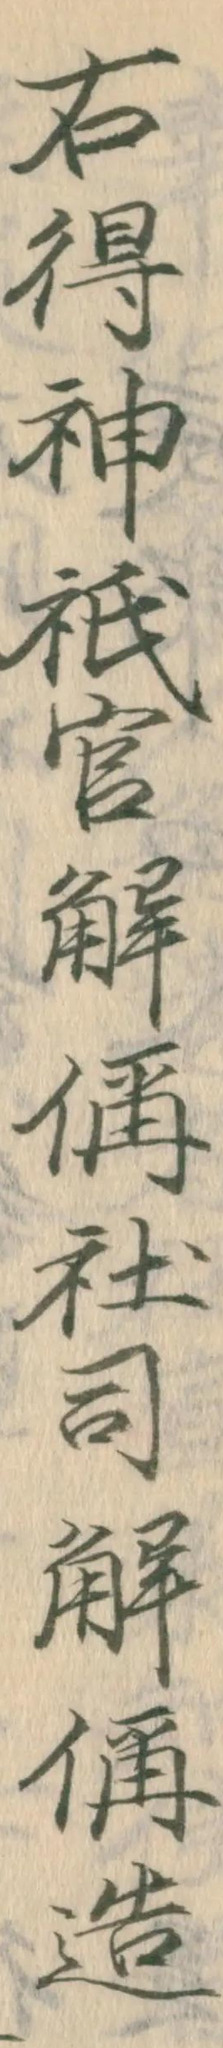右得神祇官解備社司解備造
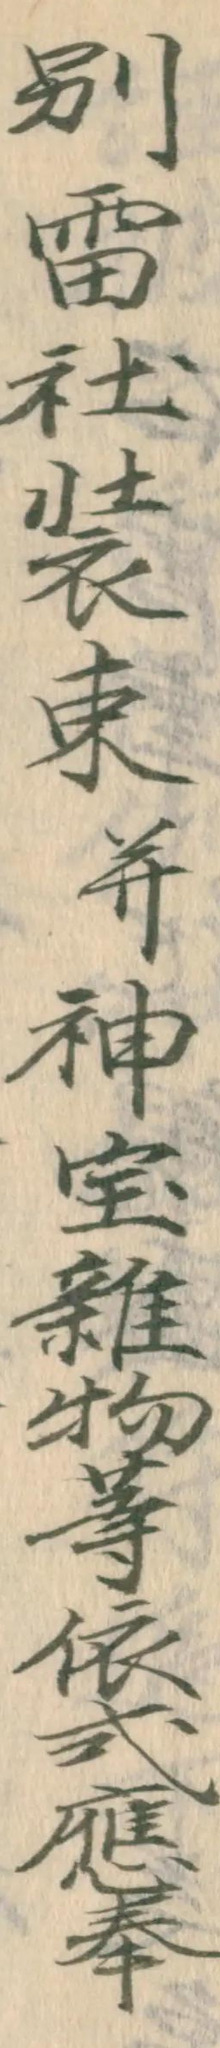別雷社装束并神宝雑物等依式応奉
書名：賀茂社記録. 第16冊
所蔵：国立国会図書館 National Diet Library, JAPAN
